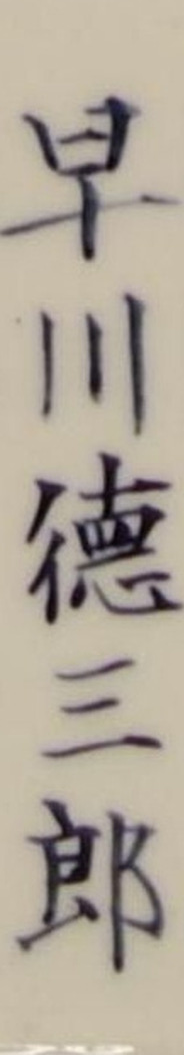早川徳三郎
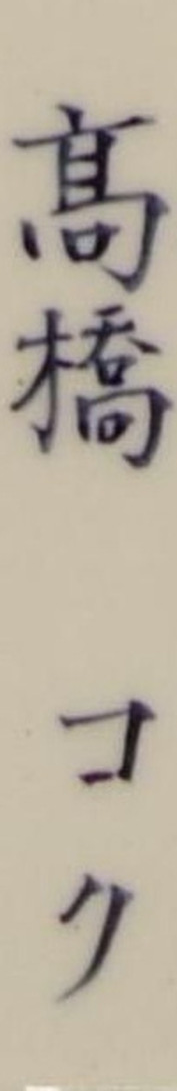高橋コク
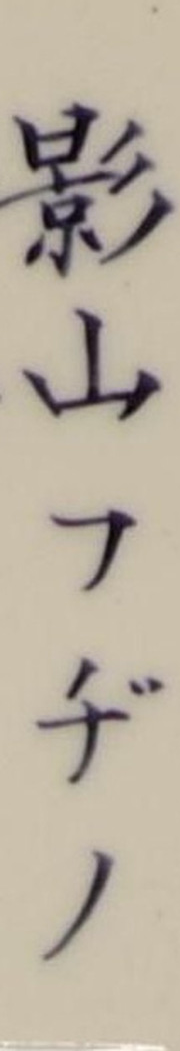影山フヂノ
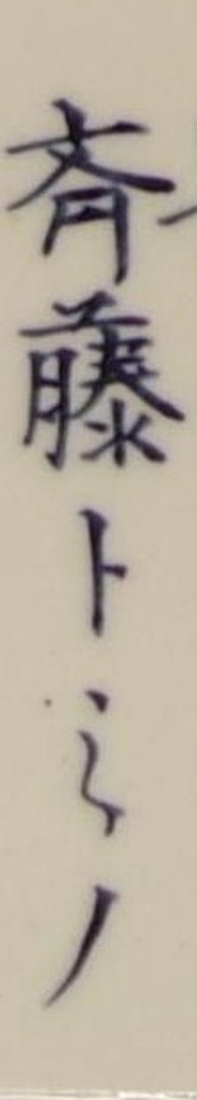斉藤トミノ
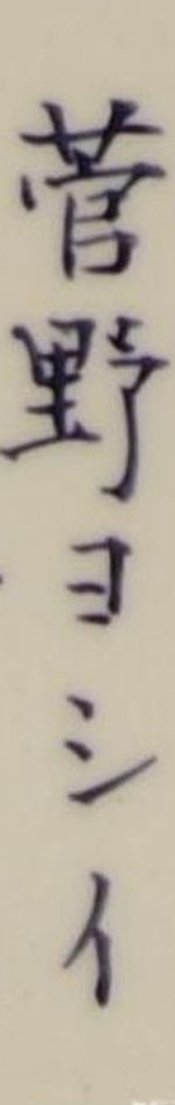菅野ヨシイ
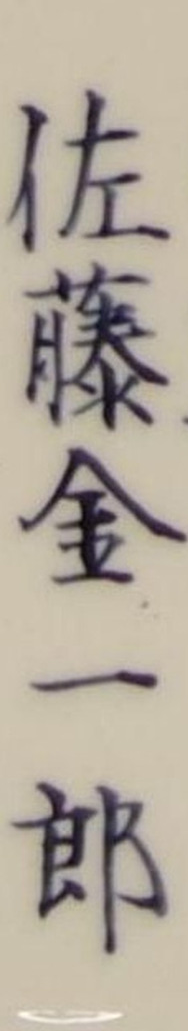佐藤金一郎
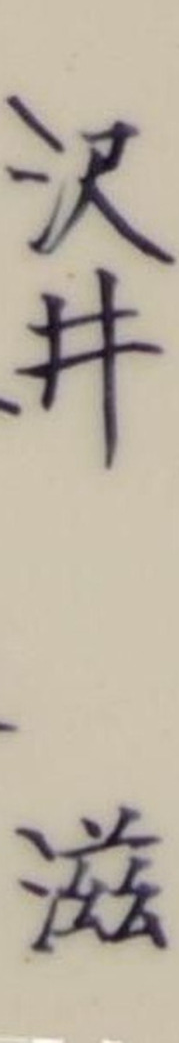沢井滋
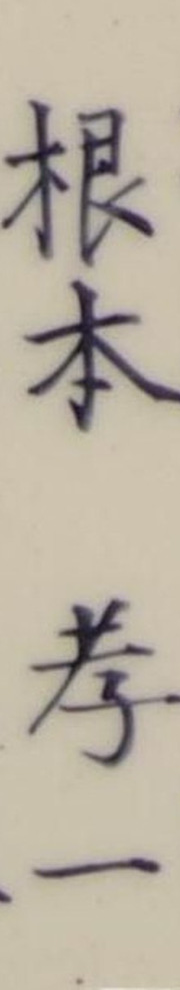根本孝一
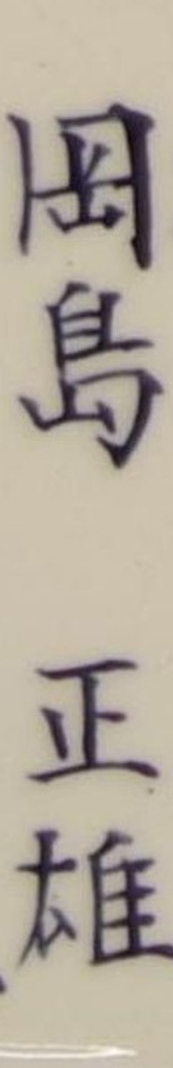岡島正雄
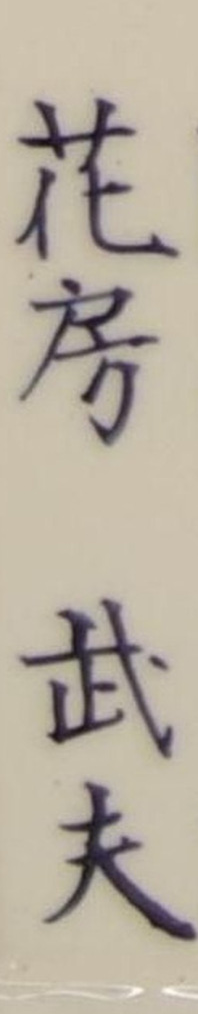花房武夫

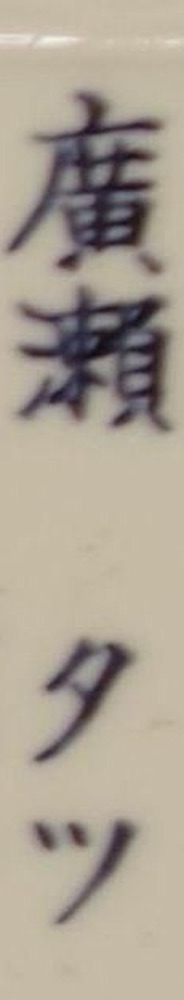広瀬タツ
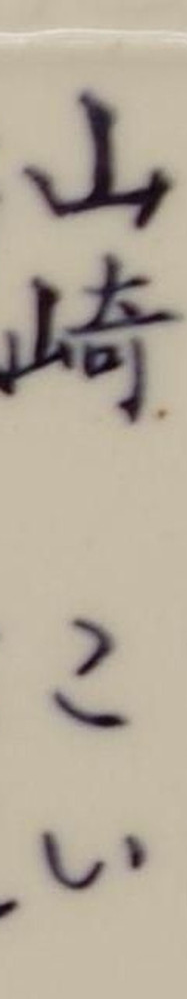山崎こい
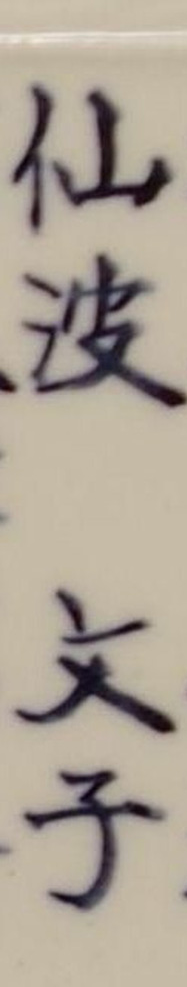仙波文子
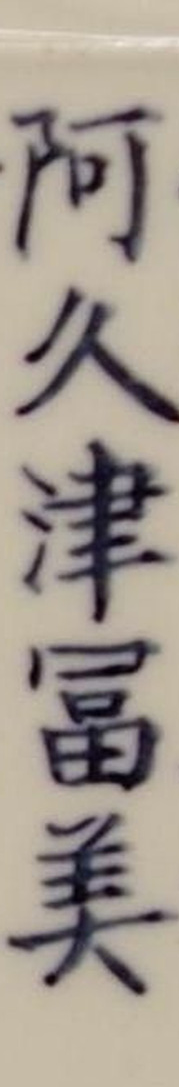阿久津冨美
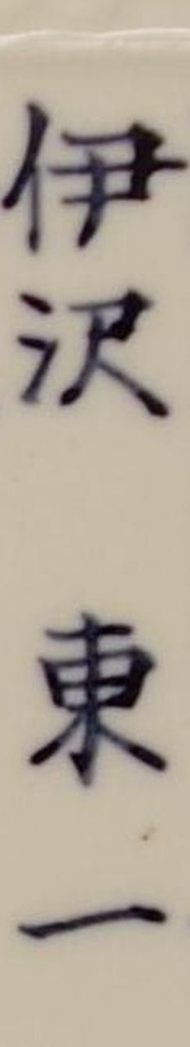伊沢東一
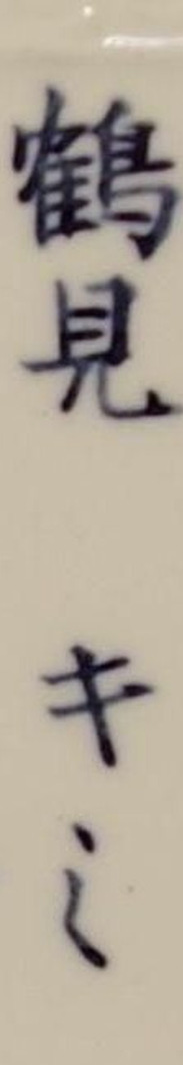鶴見キミ
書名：M~S
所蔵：高野山金剛峯寺
